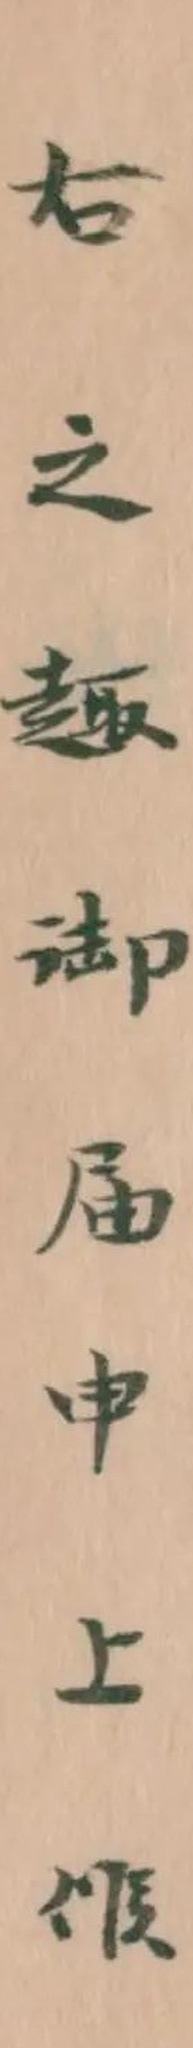右之趣御届申上候
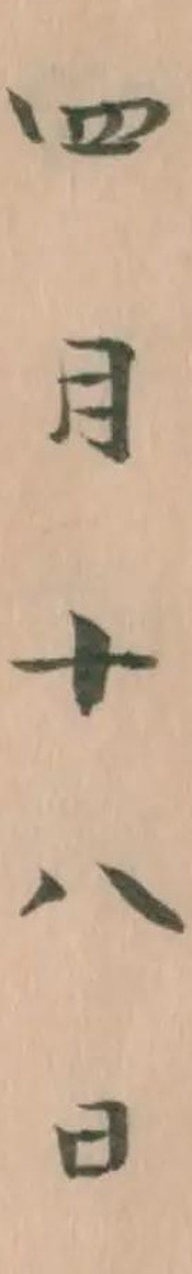四月十八日
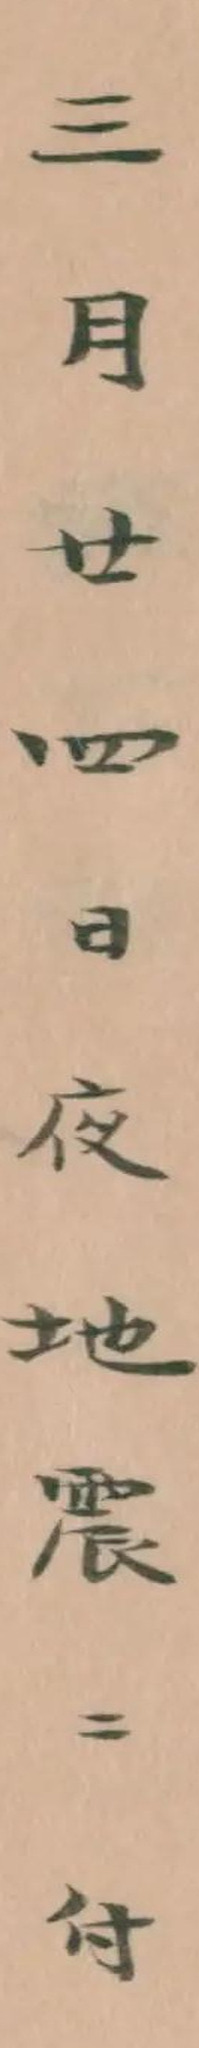三月廿四日夜地震ニ付
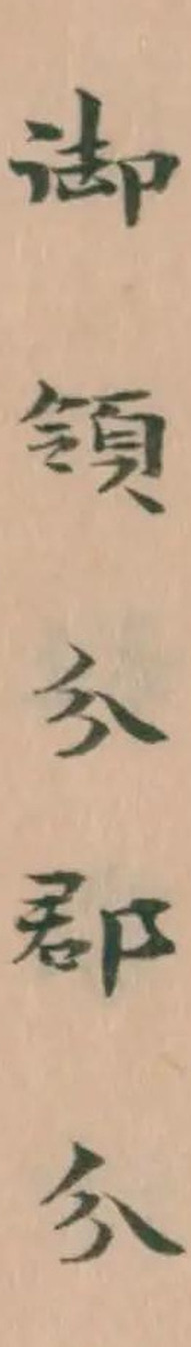御領分郡分
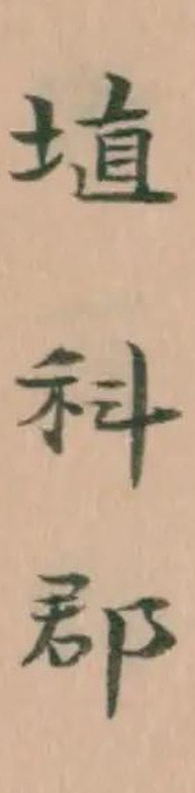埴科郡
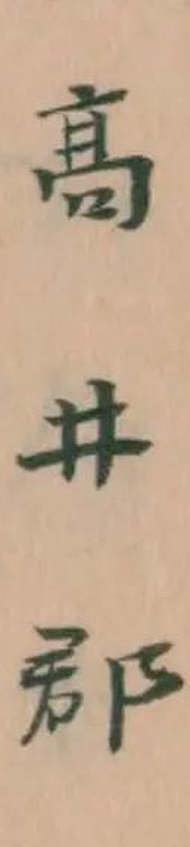高井郡
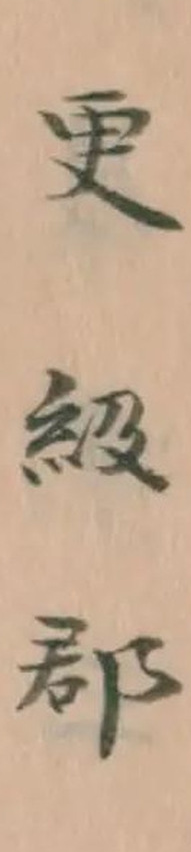更科郡
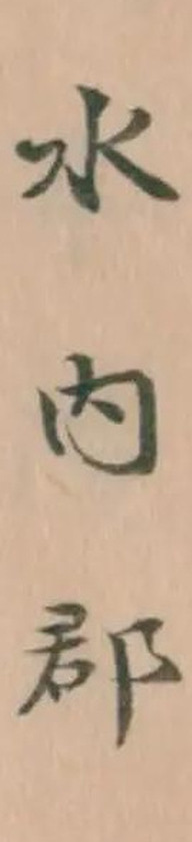水内郡

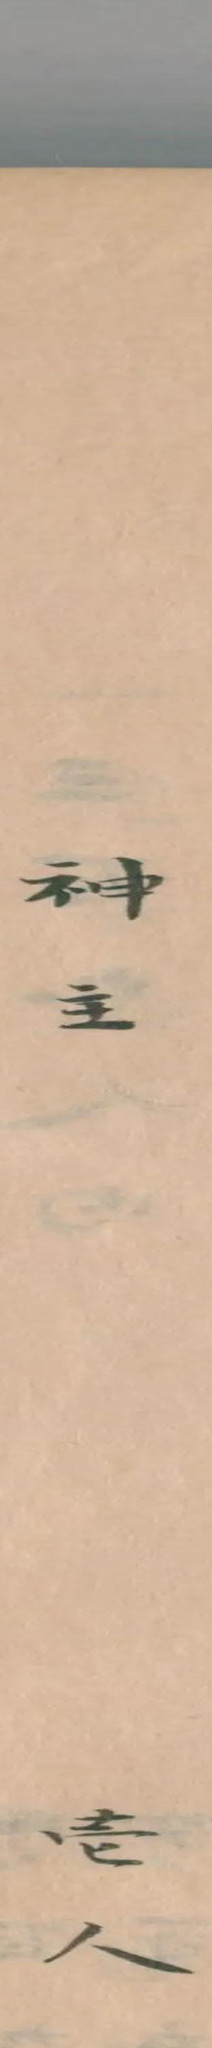神主壱人
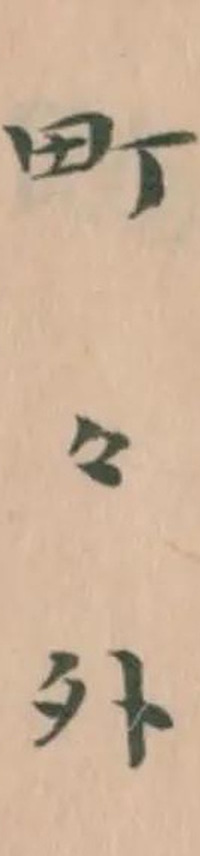町々外
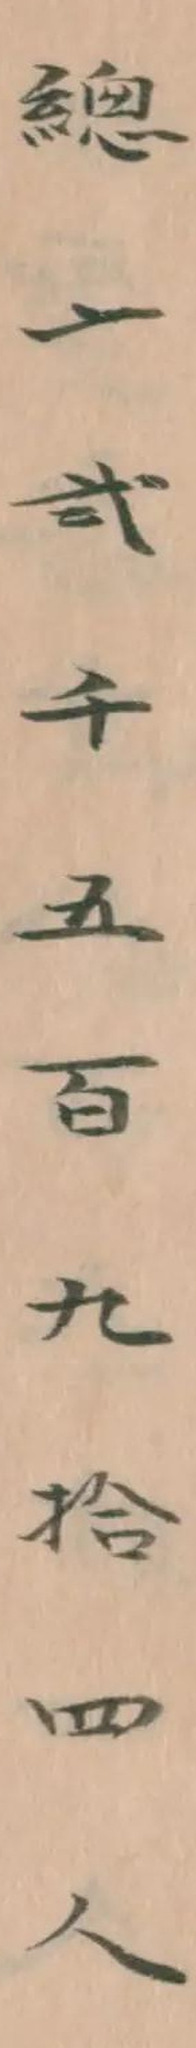總〆弐千五百九拾四人
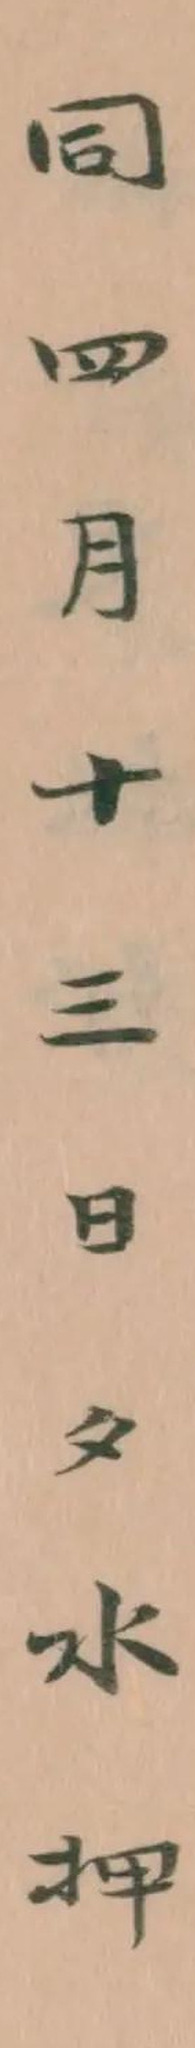同四月十三日夕水押
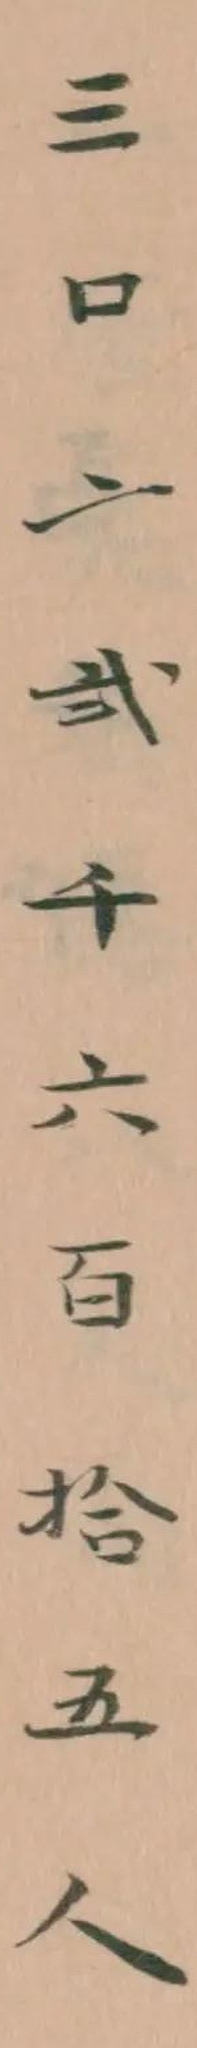三口〆弐千六百拾五人
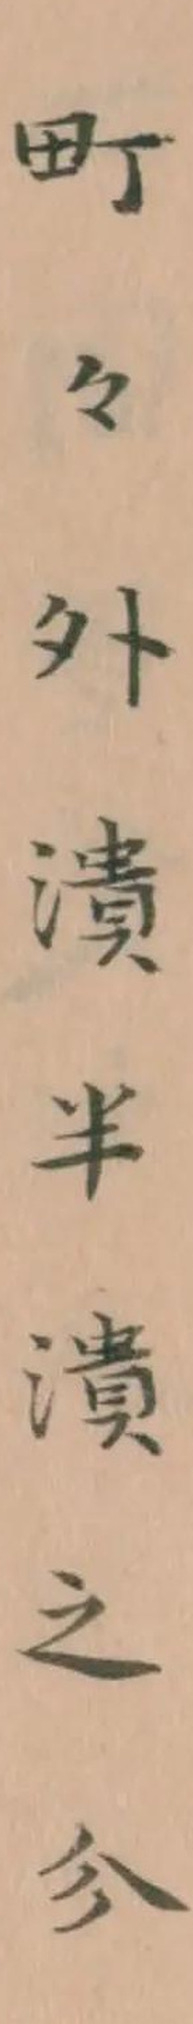町々外潰半潰之分
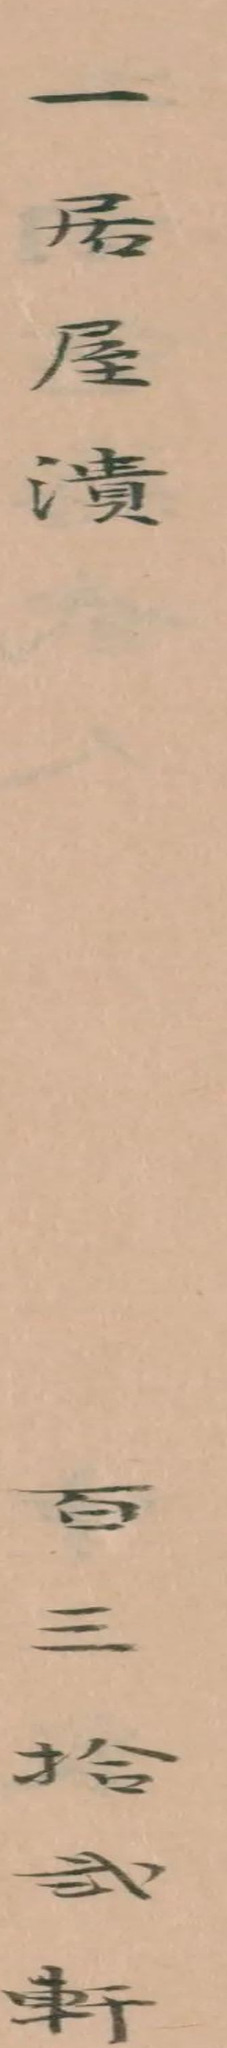一居屋潰百三拾弐軒
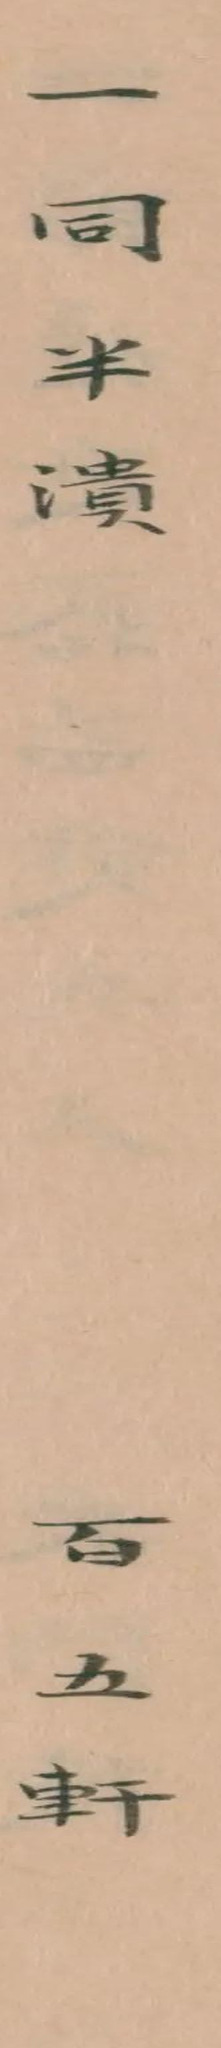一同半潰百五軒
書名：地災撮要. 巻5-6(地震之部)
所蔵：国立国会図書館 National Diet Library, JAPAN
